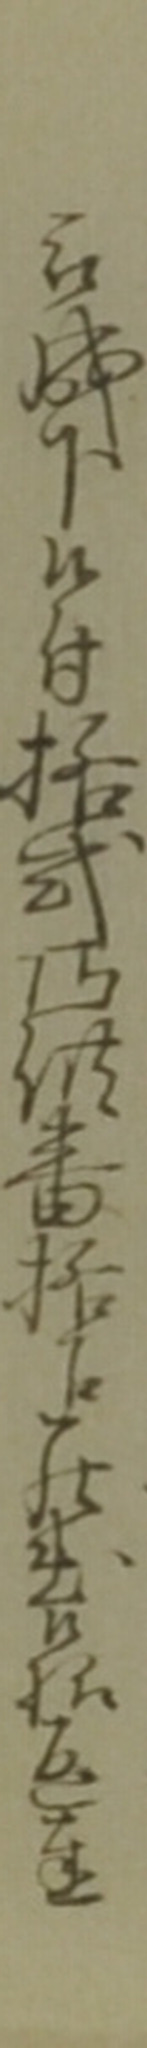被成下候付格式御供番格江罷出候様通達
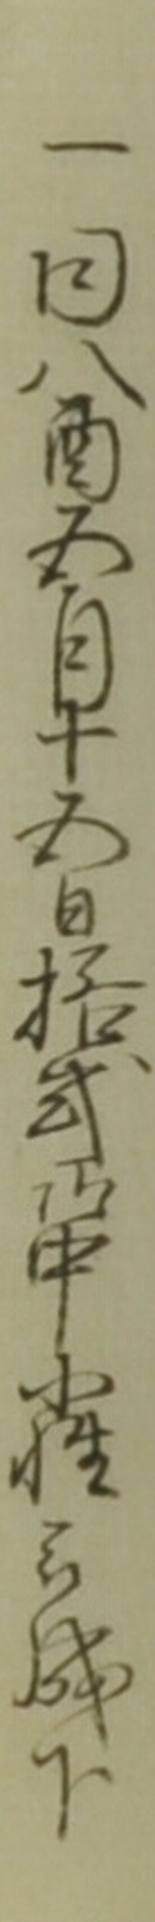一同八酉五月十五日格式御中小性被成下
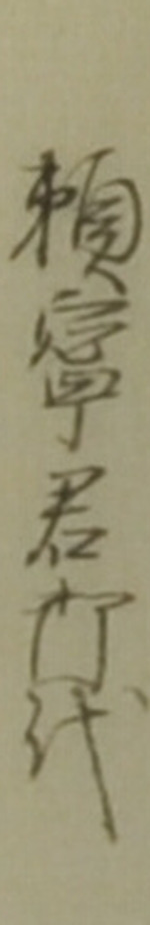頼寧君御代

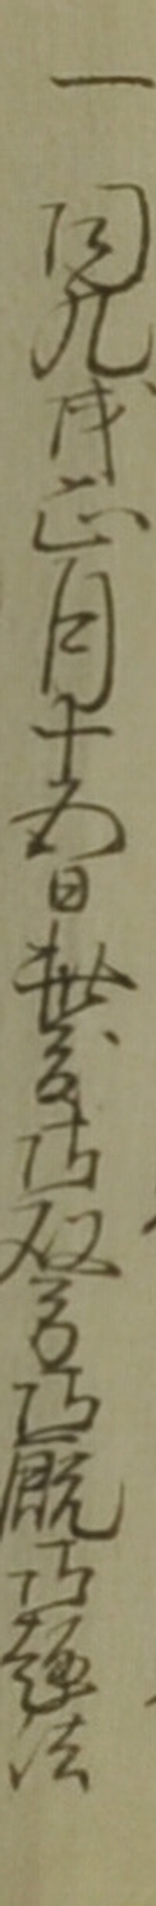一同九戌正月十五日此度御双方御厩御趣法
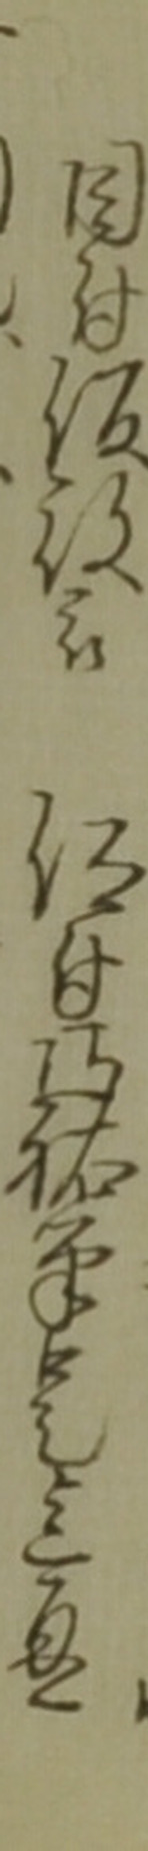目付仮役被仰付御祐筆是迄通
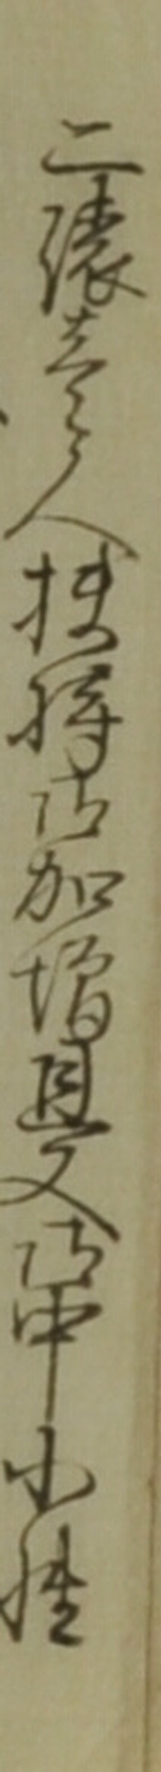二俵壱人扶持御加増且又御中小性
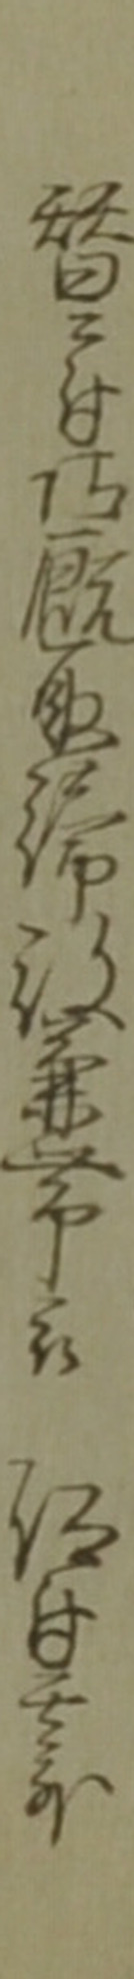替ニ付御厩取締役兼帯被仰付其外
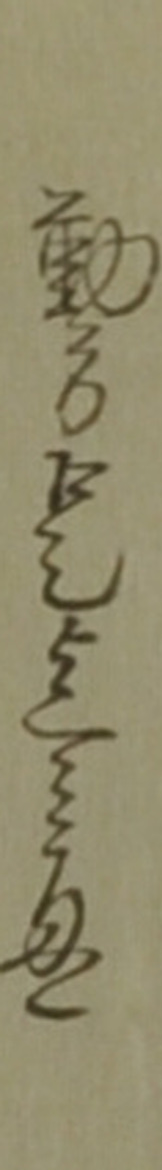勤方是迄之通
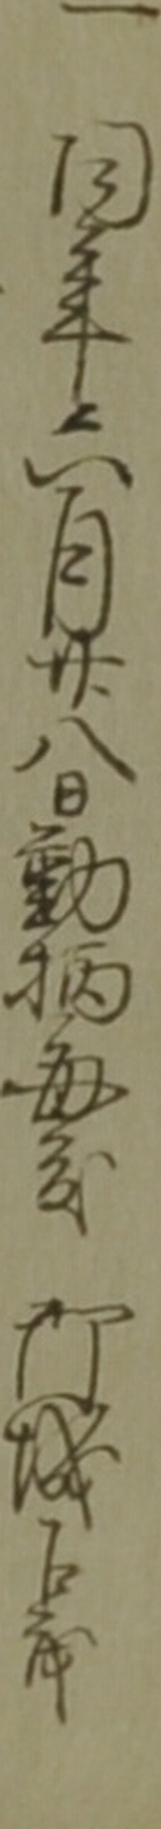一同年六月廿八日勤柄毎度御城江茂
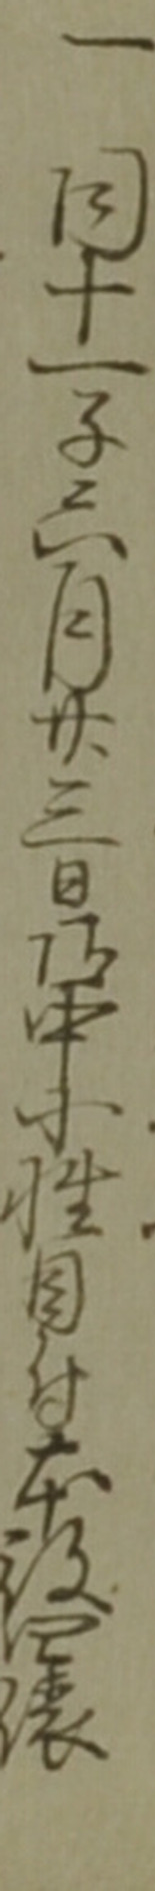一同十一子六月廿三日御中小性目付本役四俵
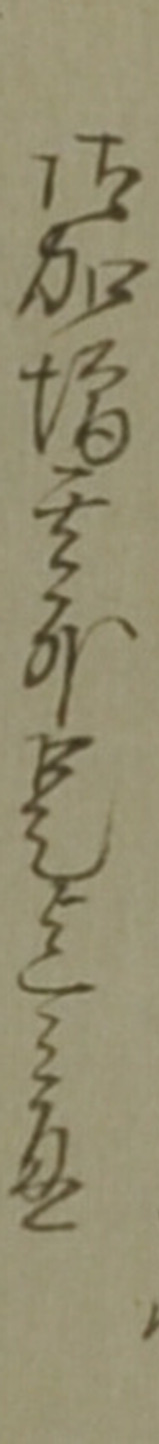御加増其外是迄之通
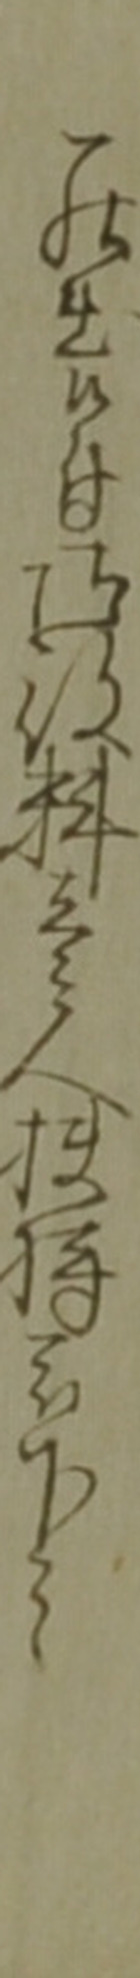罷出候付御役料壱人扶持被下之
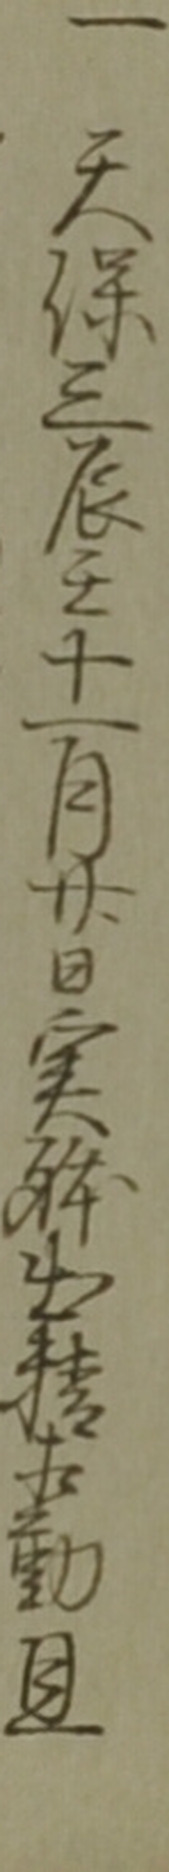一天保三辰閏十一月廿日実体出精相勤且
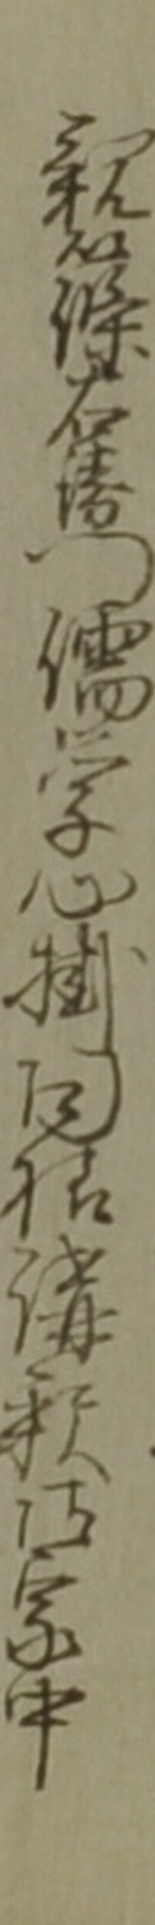親篠右衛門儒学心掛同様講釈御家中
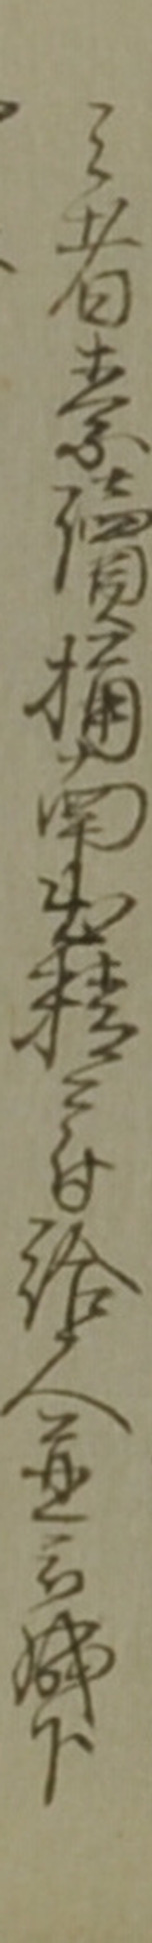之者素読桶南出精ニ付給人並被成下
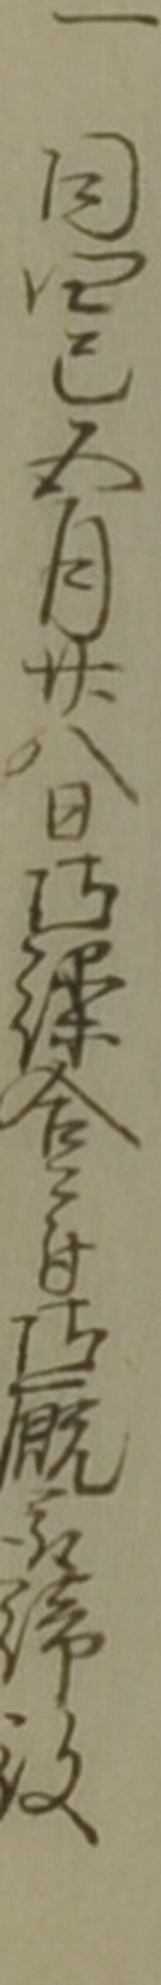一同四巳五月廿八日御繰合ニ付御厩取締役
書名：無足廃家（弐）
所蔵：伊那市立高遠町図書館・合同会社AMANE
